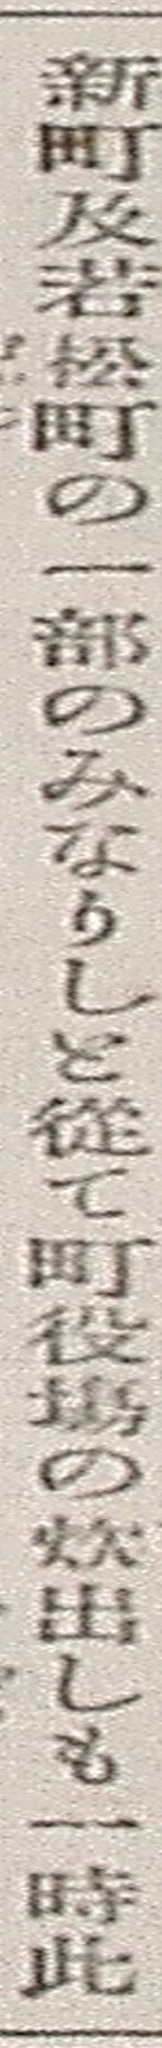新町及若松町の一部のみなりしと従て町役場の炊出しも一時此
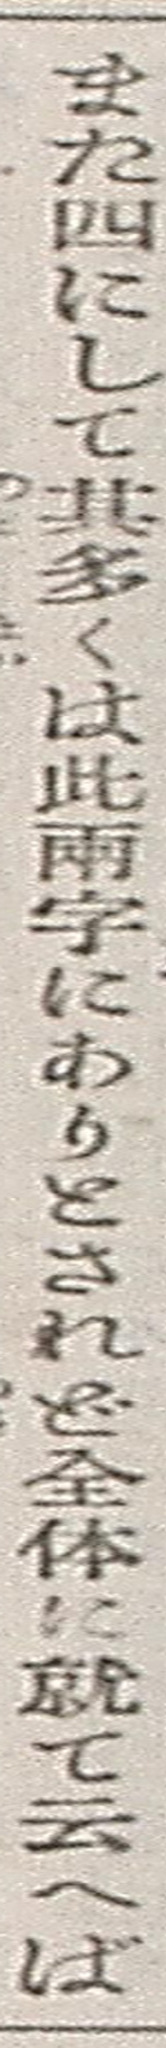又四にして其多くは此両字にありとされど全体に就て云へば
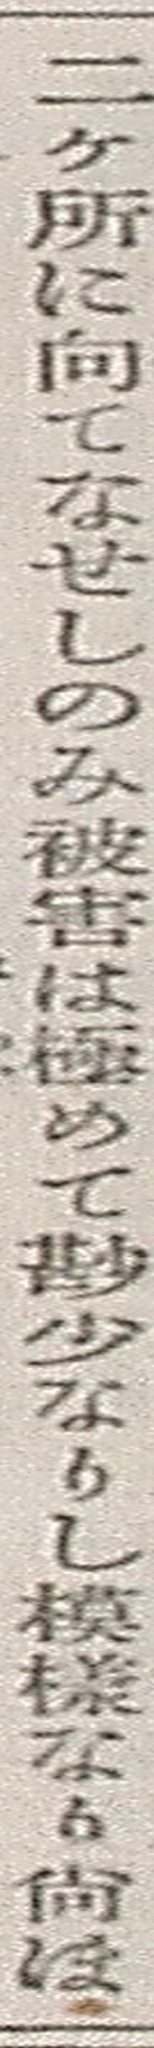二ヶ所に向てなせしのみ被害は極めて尠少なりし模様なり尚ほ
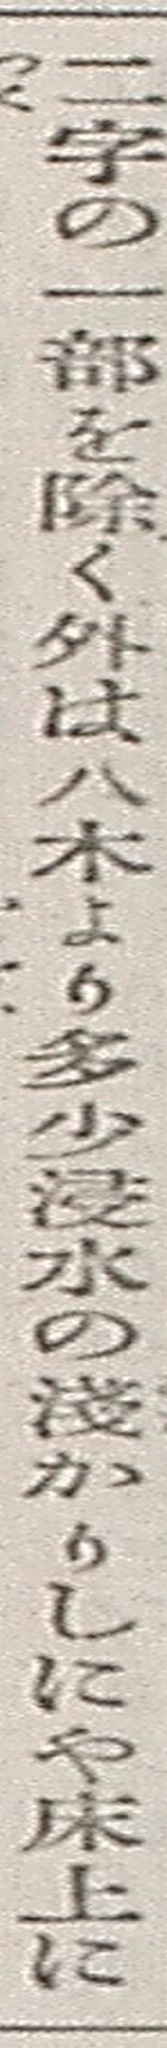二字の一部を除く外は八木より多少浸水の浅かりしにや床上に
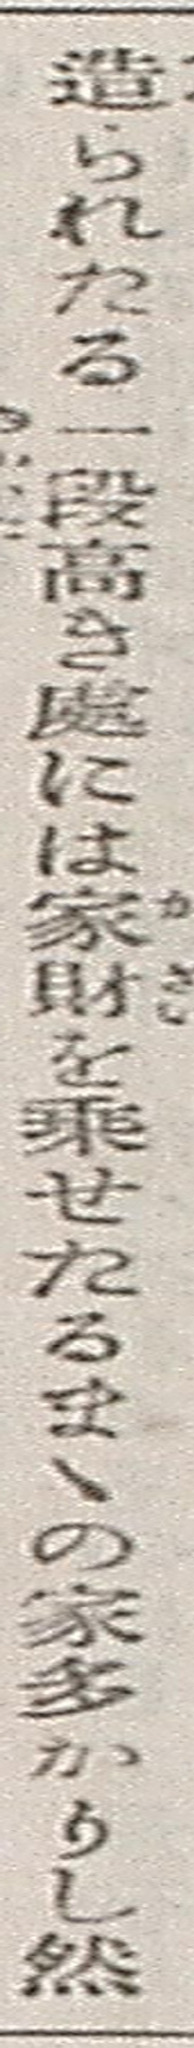造られたる一段高き処には家財を乗せたるまゝの家多かりし然
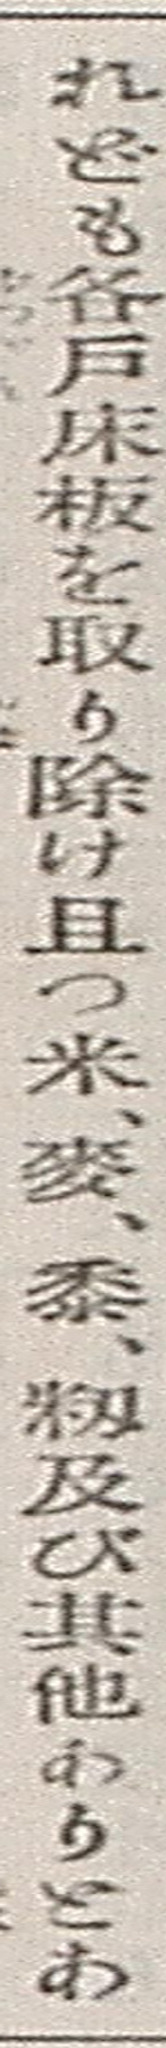れども各戸床板を取り除け且つ米、麦、黍、籾及び其他ありとあ
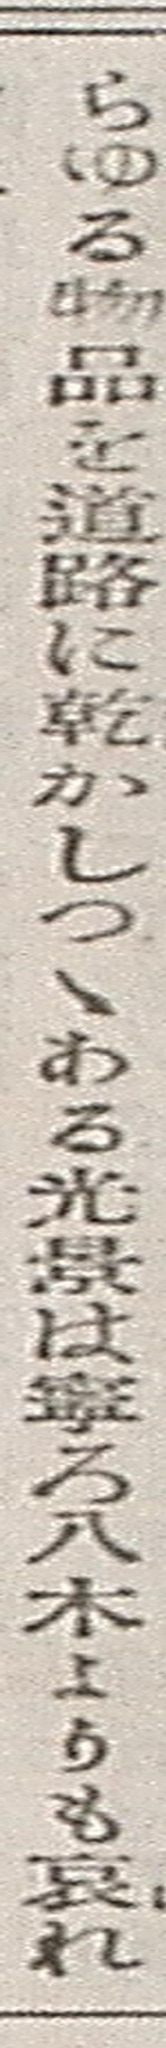らゆる物品を道路に乾かしつゝある光景は寧ろ八木よりも哀れ
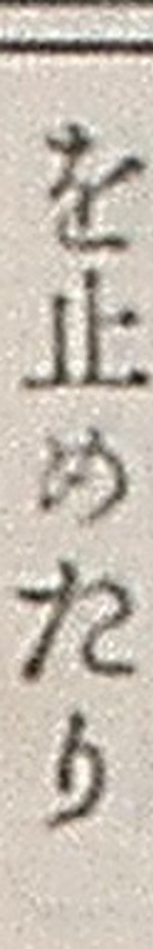を止めたり
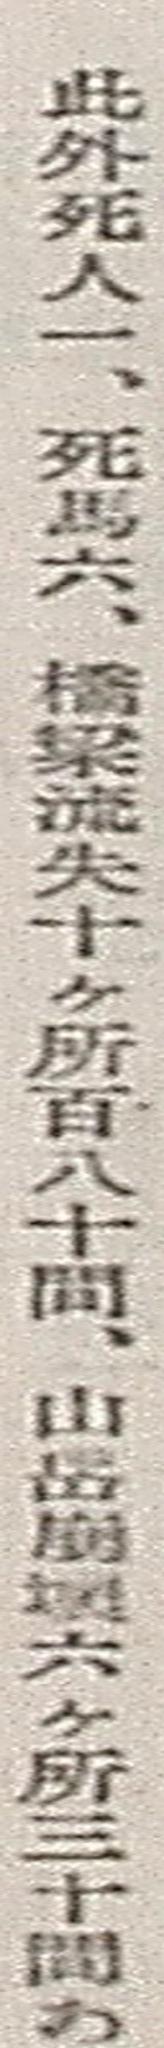此外死人一、死馬六、橋梁流失十ヶ所百八十間、山岳崩壊六ヶ所三十間あり五ヶ
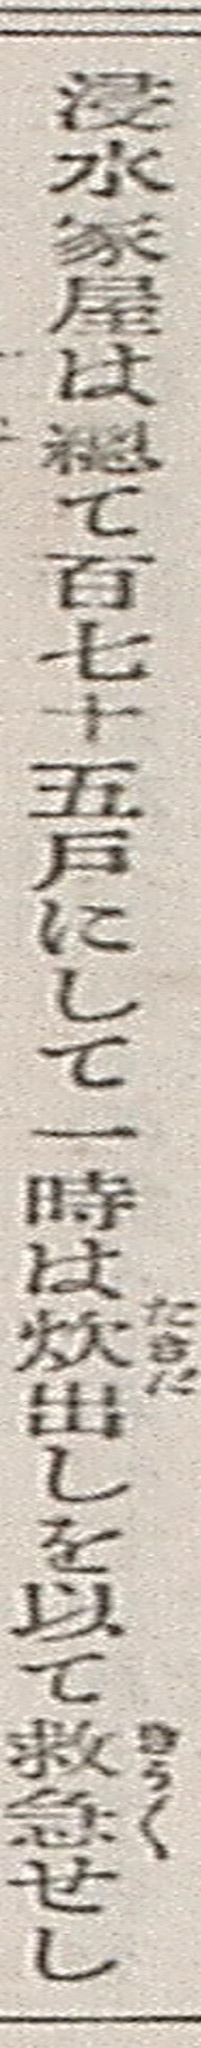浸水家屋は総て百七十五戸にして一時は炊出しを以て救急せし
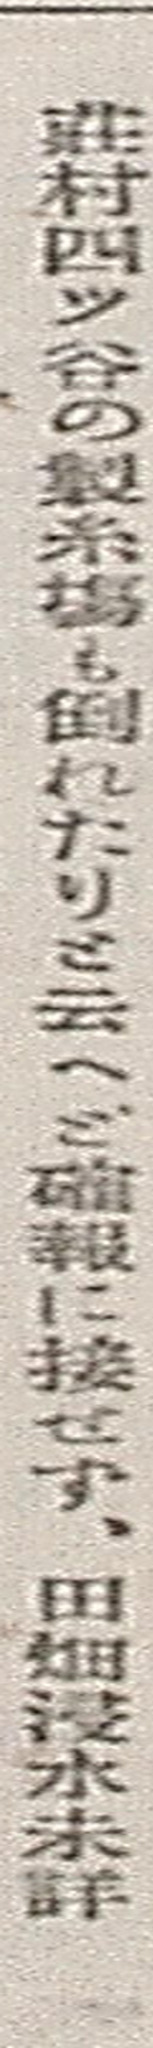荘村四ッ谷の製糸場も倒れたりと云へど確報に接せず、田畑浸水未詳
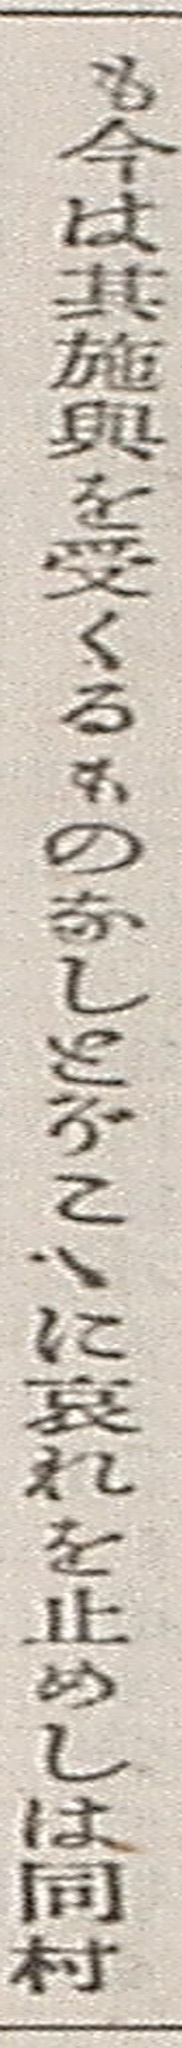も今は其施輿を受くるものなしとずこゝに哀れを止めしは同村
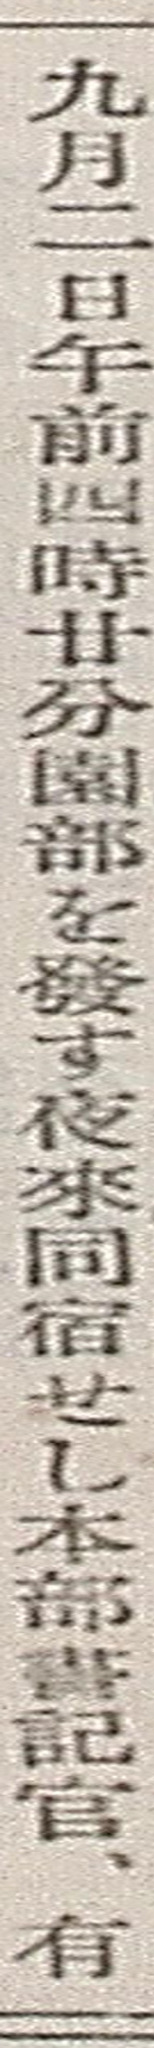九月二日午前四時二十分園部を発す夜来同宿せし本部書記官、有
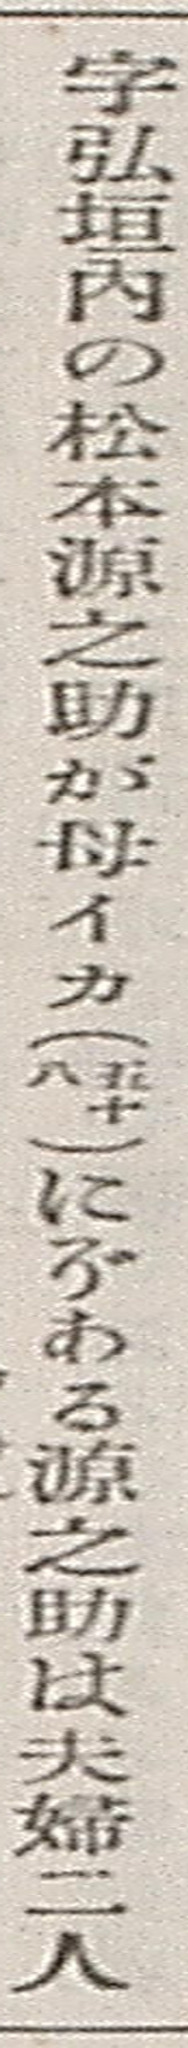字弘垣内の松本源之助が母イカにぞある源之助は夫婦二人
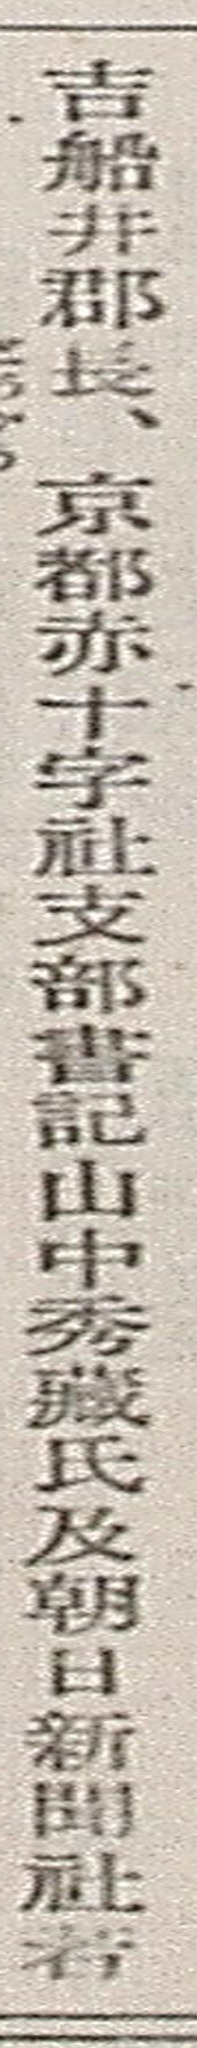吉船井郡長、京都赤十字社支部書記山中秀蔵氏及朝日新聞社若
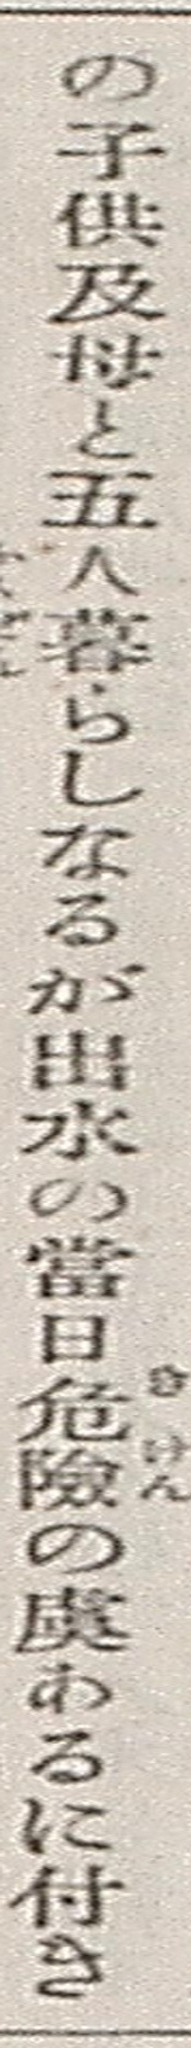の子供及母と五人暮らしなるが出水の当日危険の虞あるに付き
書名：風俗畫報臨時増刊第百二十六號　洪水被害録（中）
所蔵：東京大学地震研究所図書室 Earthquake Research Institute Library, The University of Tokyo, JAPAN
